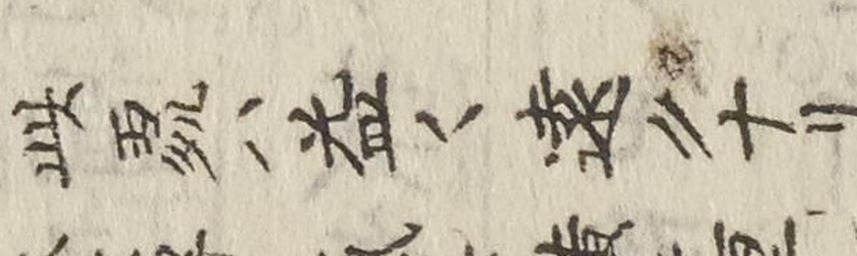此処ハ舩稍遠クナリ
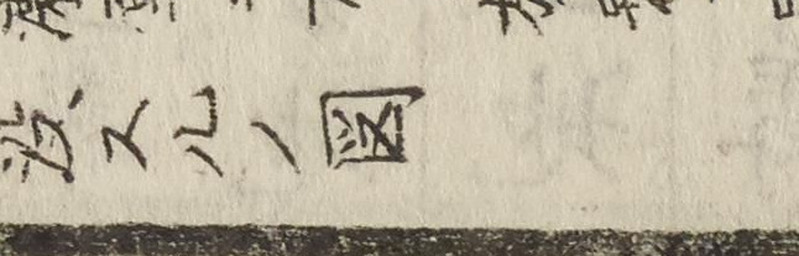没スルノ図
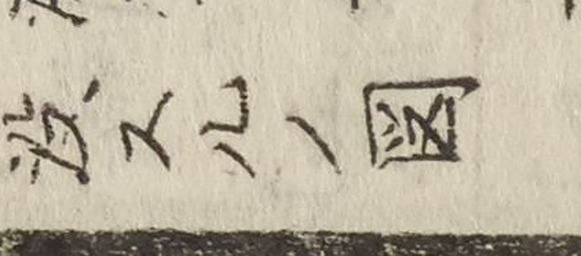没スルノ図
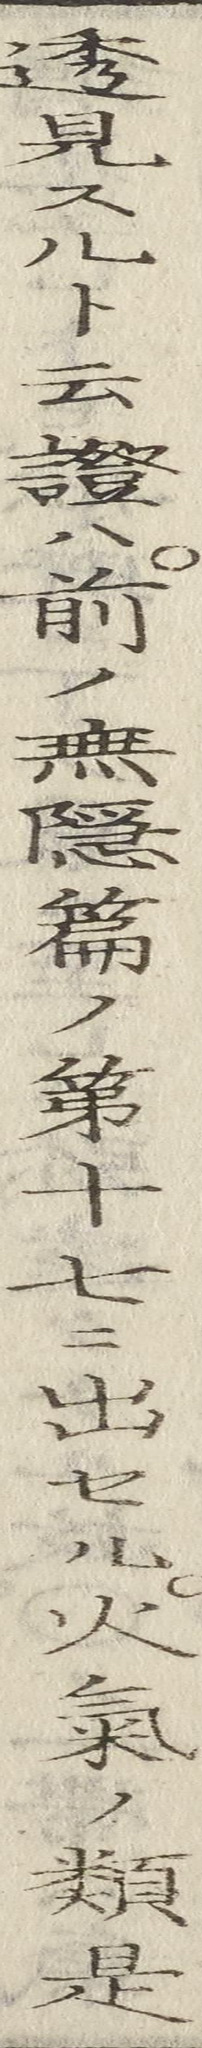透見スルト云証ハ。前ノ無隠篇ノ第十七ニ出セル。火気ノ類是
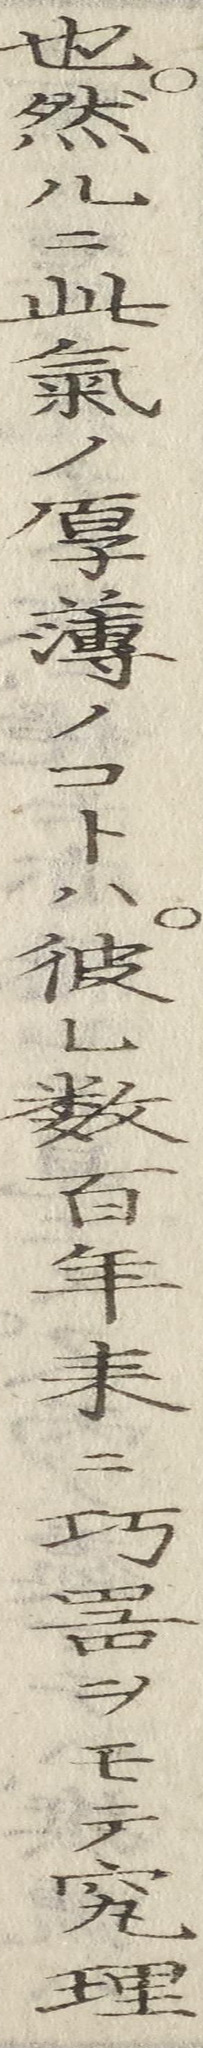也。然ルニ此気ノ厚薄ノコトハ。彼レ数百年来ニ巧器ヲモテ究理
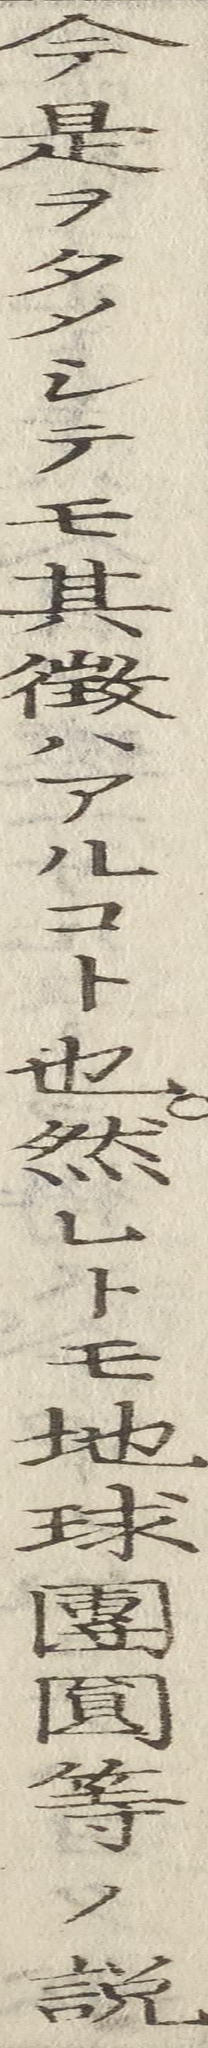今是ヲタメシテモ其徴ハアルコト也。然レトモ地球団円等ノ説
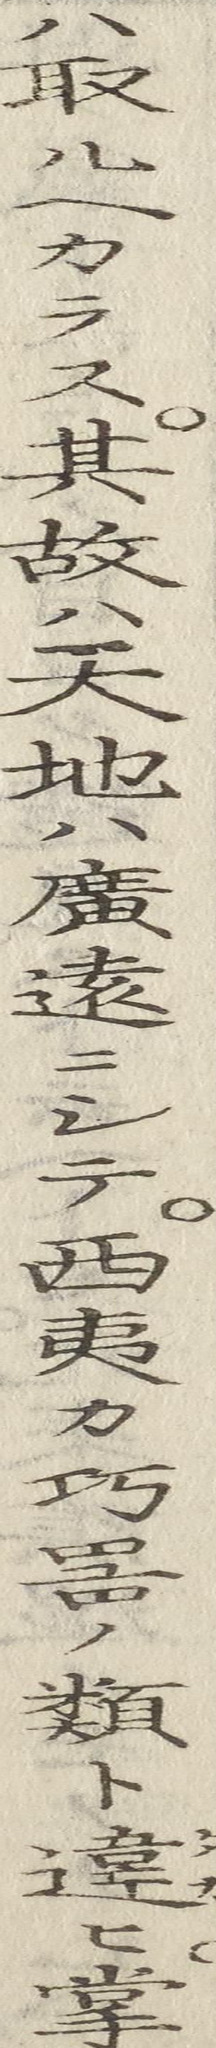ハ取ルヘカラス。其故ハ天地ハ広遠ニシテ。西夷カ巧器ノ類ト違ヒ。掌
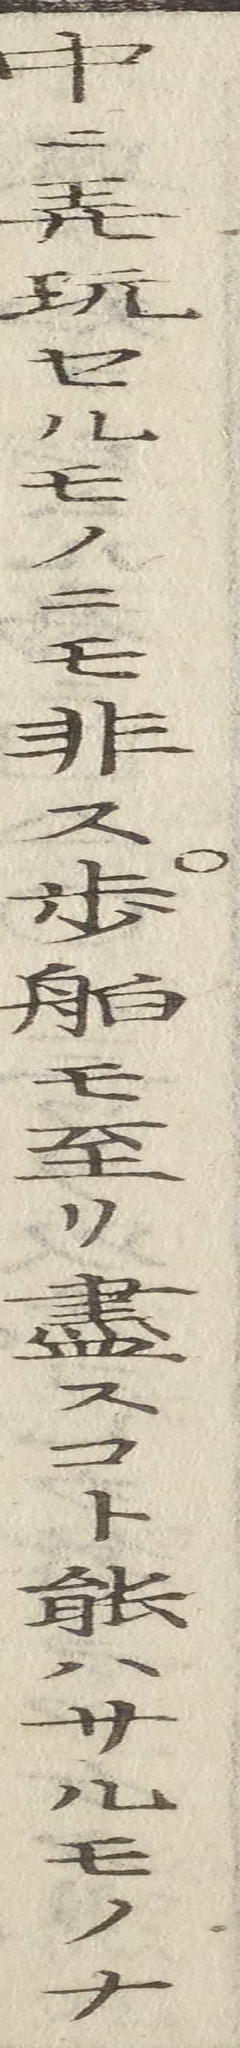中ニ弄玩セルモノニモ非ス。歩舶モ至リ尽スコト能ハサルモノナ
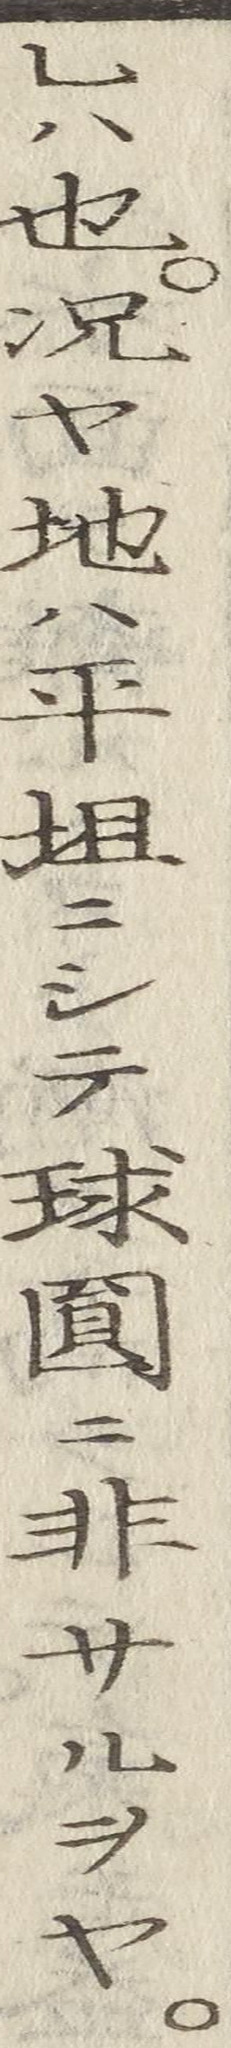レハ也。況ヤ地ハ平坦ニシテ球円ニ非サルヲヤ。
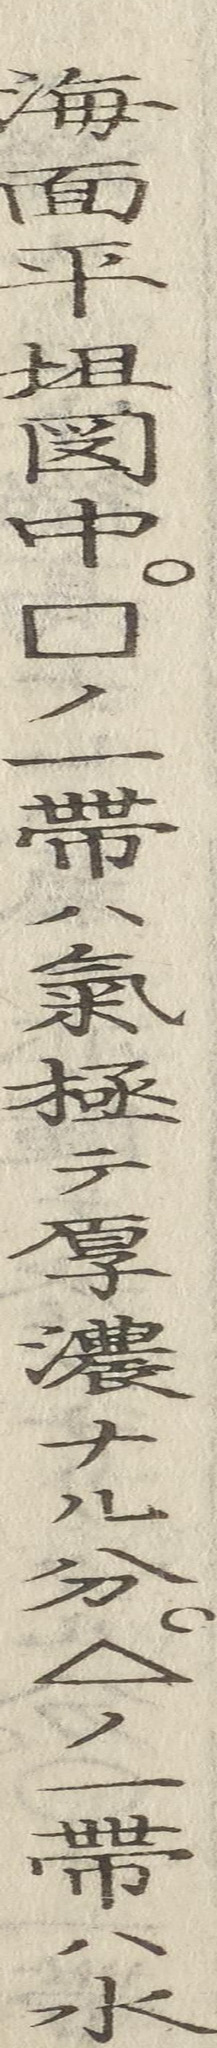海面平坦図中。口ノ一帯ハ気極テ厚濃ナル分。△ノ一帯ハ水

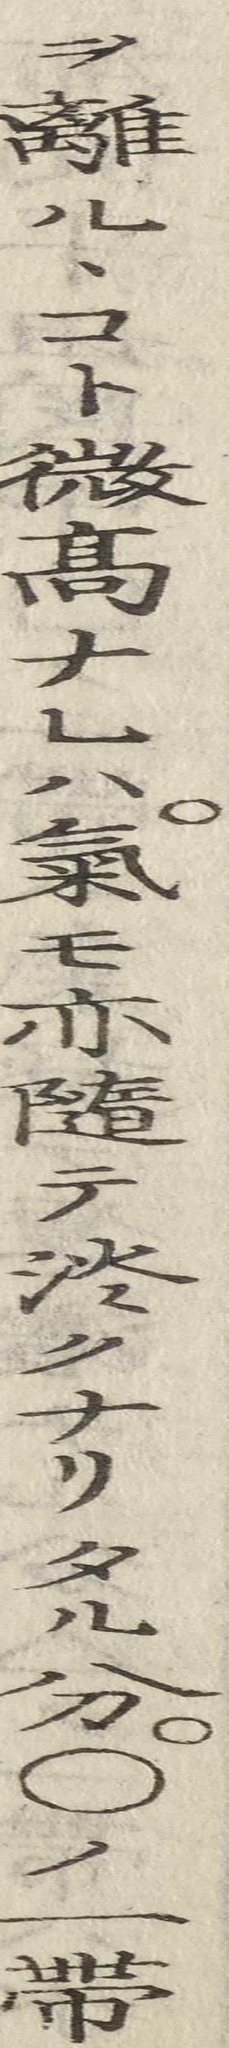ヲ離ルヽコト微高ナレハ。気モ亦随テ淡クナリタル分。○ノ一帯
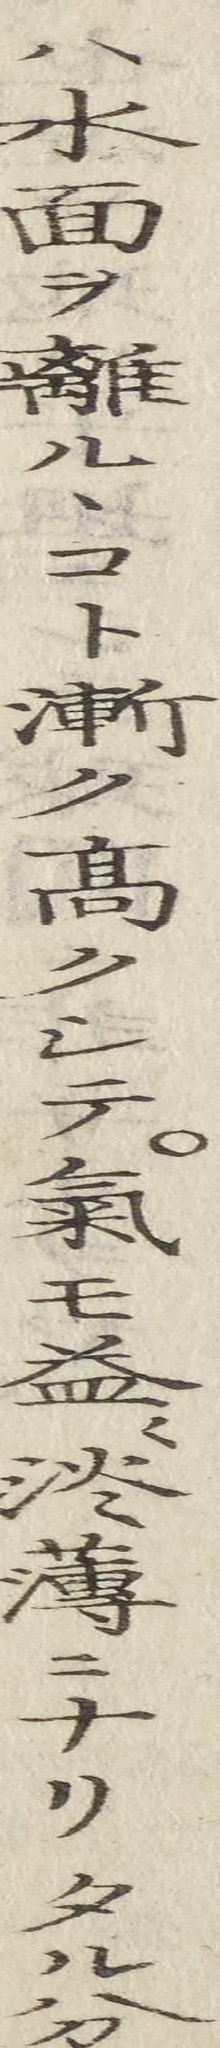ハ水面ヲ離ルヽコト漸ク高クシテ。気モ益々淡薄ニナリタル分
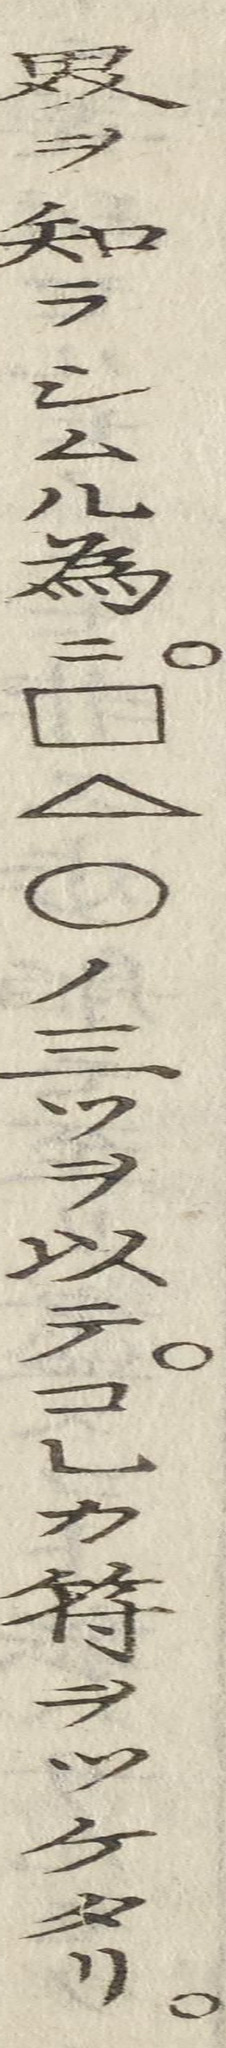界ヲ知ラシムル為ニ。ロ△○ノ三ツヲ以テ。コレカ符ヲツケタリ。
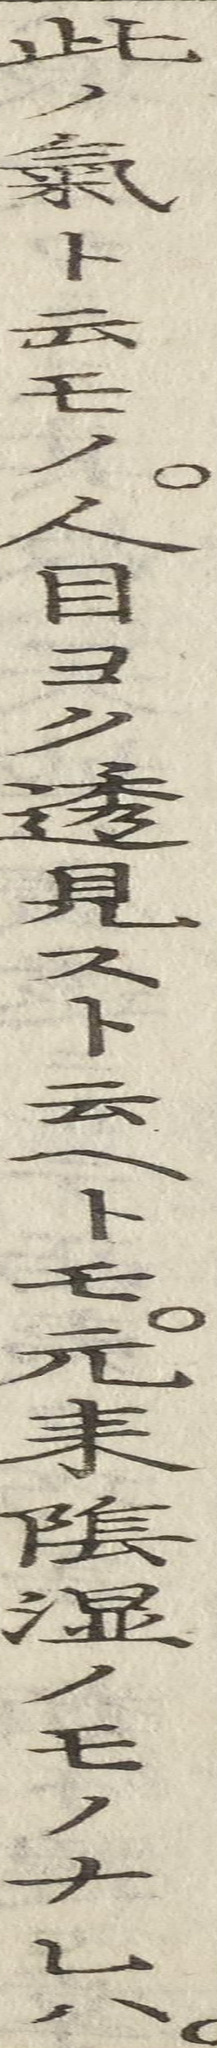此ノ気ト云モノ。人目ヨク透見スト云ヘトモ。元来陰湿ノモノナレハ。
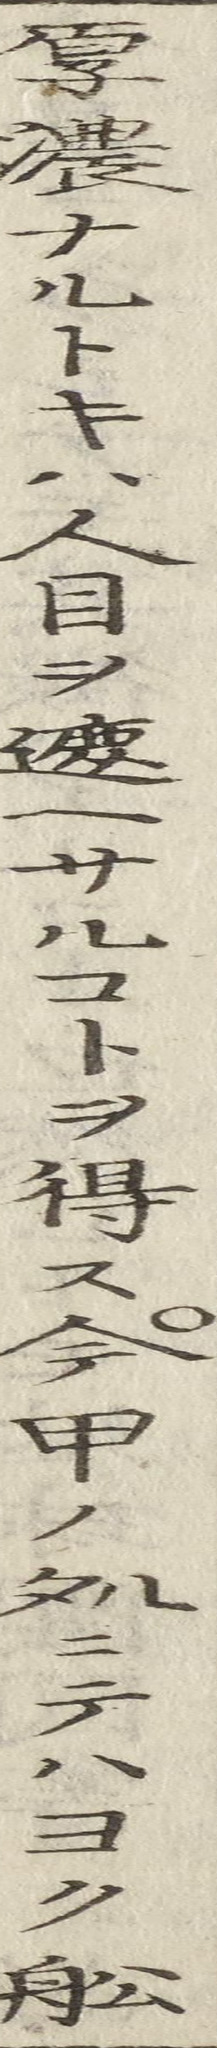厚濃ナルトキハ人目ヲ遮ヘサルコトヲ得ス。今甲ノ処ニテハヨク舩
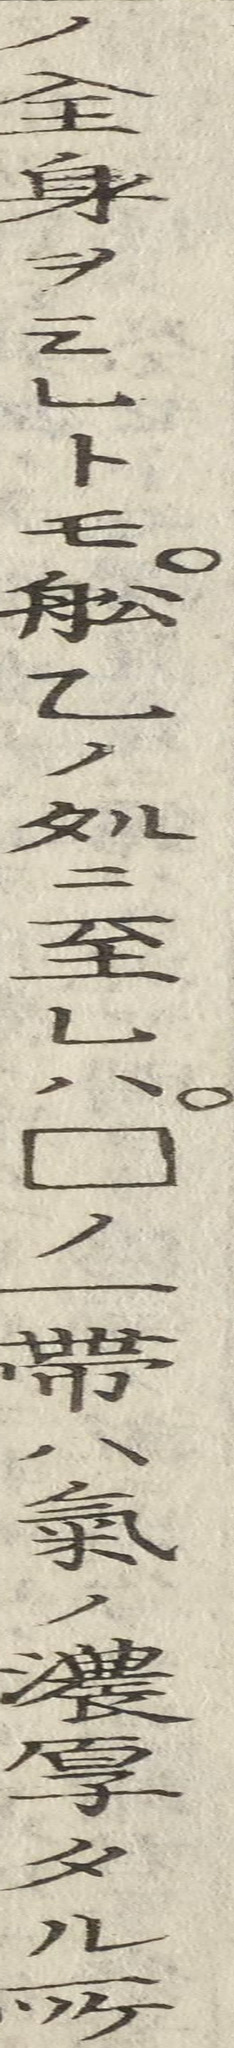ノ全身ヲミレトモ。舩乙ノ処ニ至レハ。ロノ一帯ハ気ノ濃厚タル所
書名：護法新論　中
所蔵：東京大学地震研究所図書室 Earthquake Research Institute Library, The University of Tokyo, JAPAN
